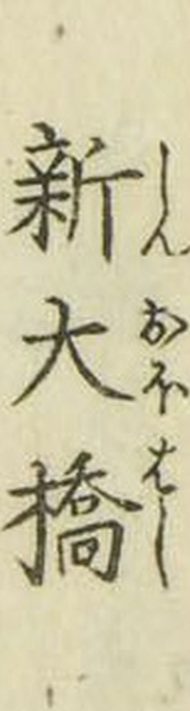新大橋
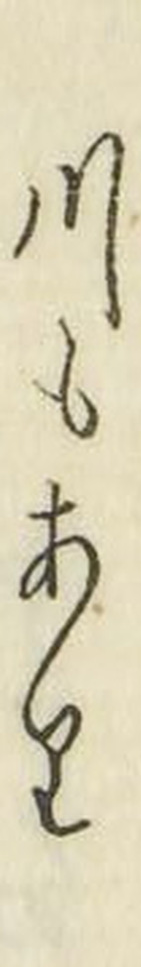川もあり
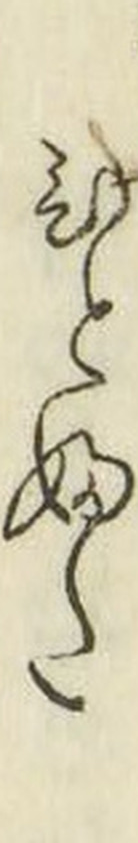ひとふた
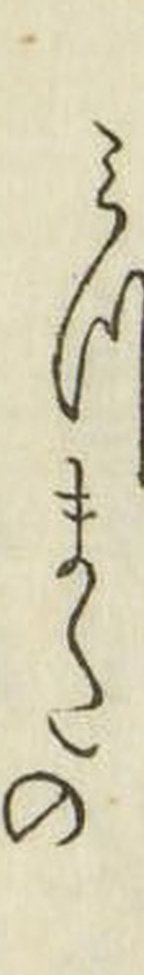みつまたの

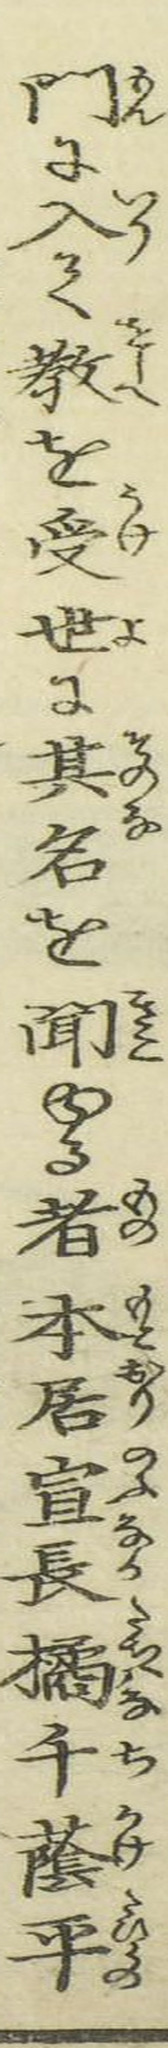門に入て教を受世に其名を聞ゆる者本居宣長橘千蔭平
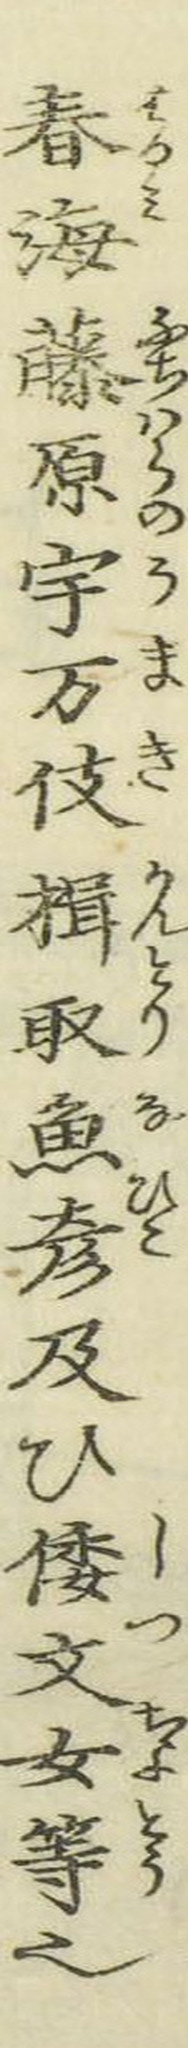春海藤原宇万伎楫取魚彦及ひ倭文女等也
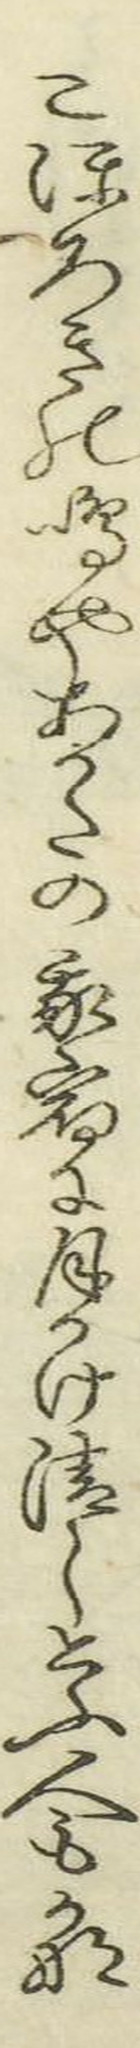こほろきの鳴やあかたの我宿に月かけ清しとふ人もかな
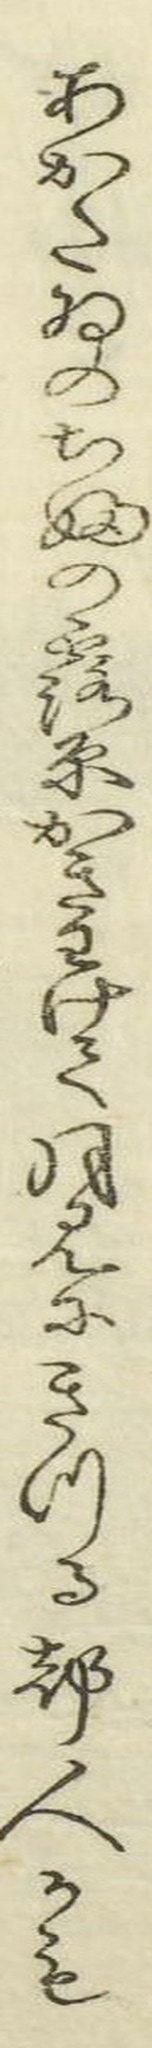あかたゐのちふの露原かきわけて月見にきつる都人かも
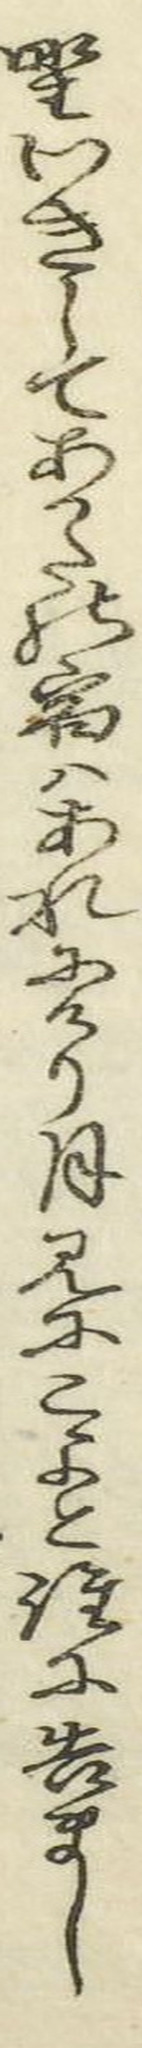野わきしてあかたの宿はあれにけり月見にこよと誰に告まし
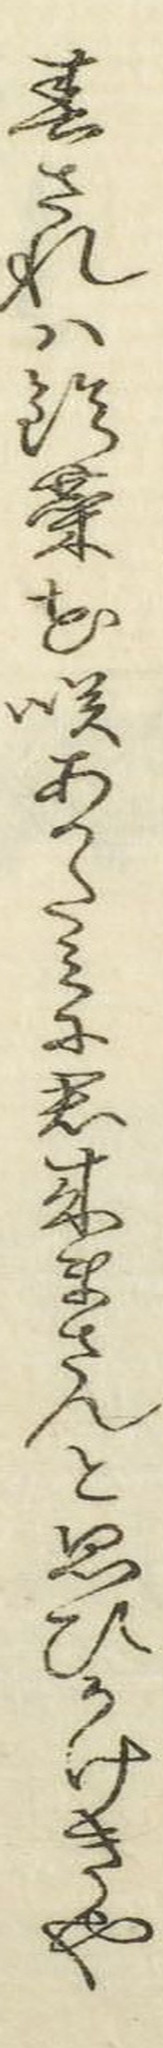春されは鈴菜花咲あかたみに君来まさんと思ひかけきや
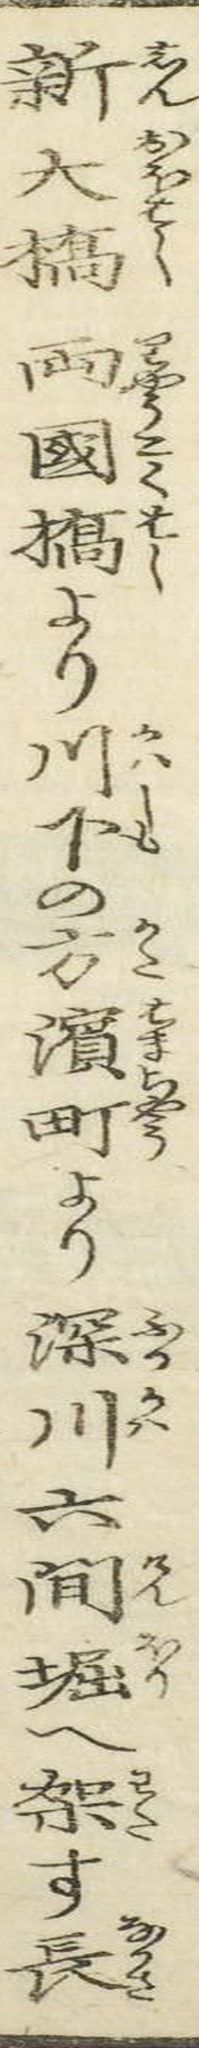新大橋両國橋より川下の方濱町より深川六間堀へ架す長
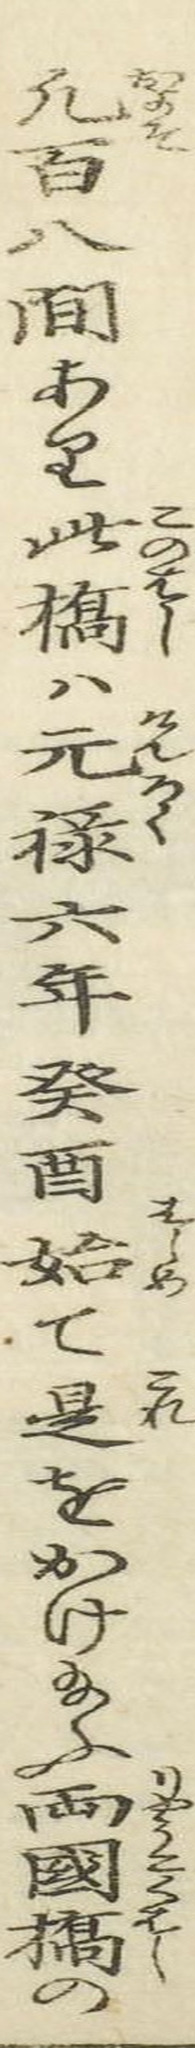凡百八間あり此橋は元禄六年癸酉始て是をかけ給ふ両國橋の
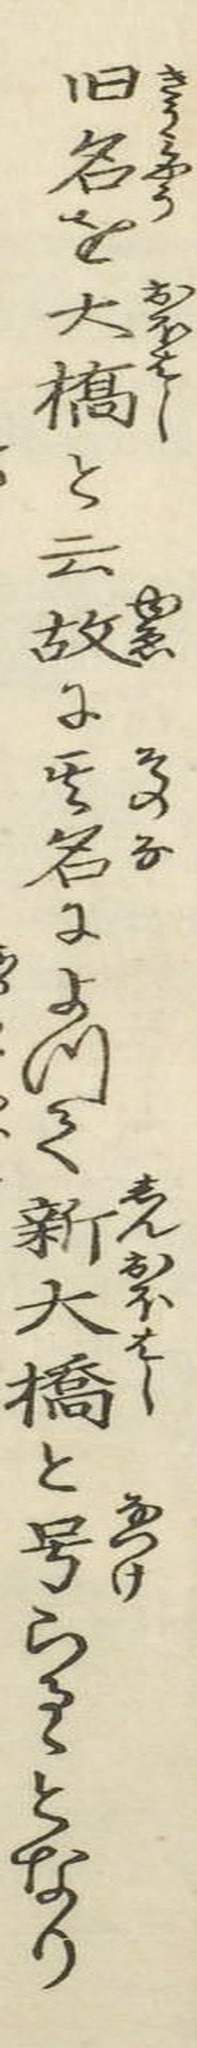旧名を大橋と云故に其名によつて新大橋と号らるゝとなり
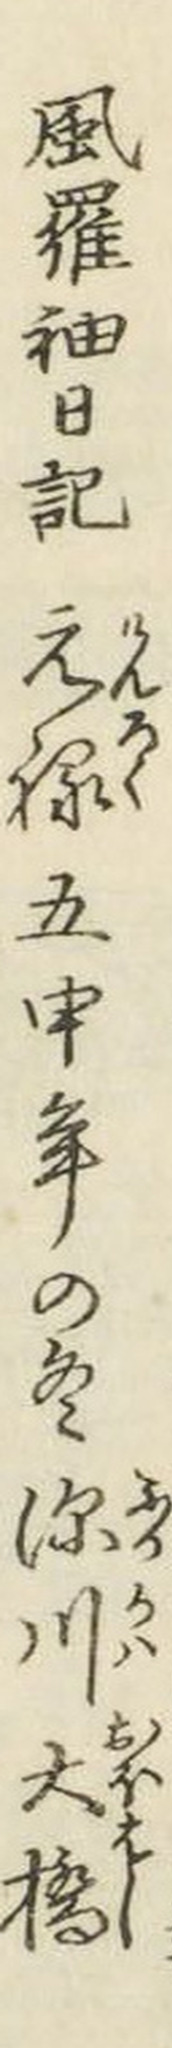風羅袖日記元禄五申年の冬深川大橋
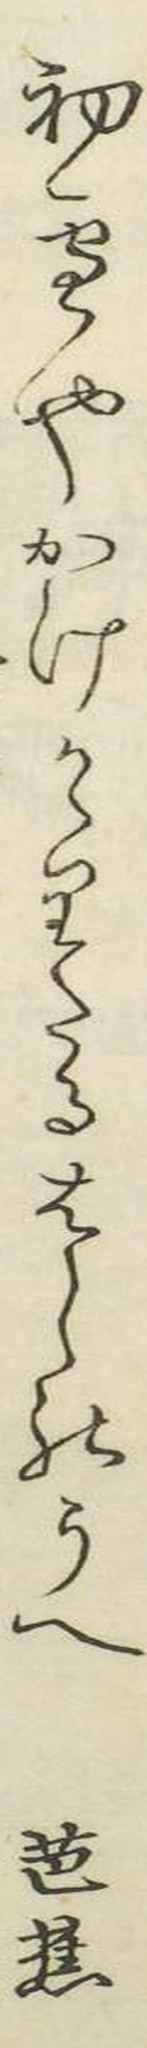初雪やかけかゝりたるはしのうへ芭蕉
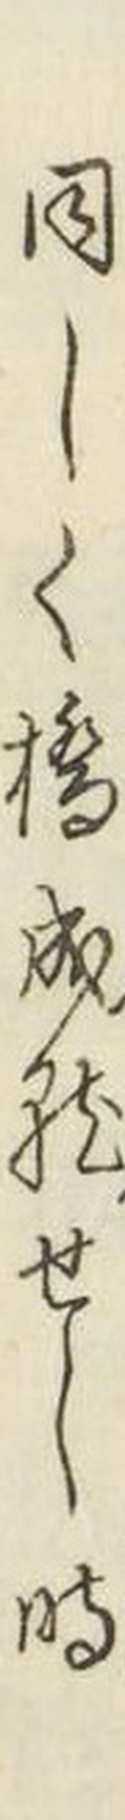同しく橋成就せし時
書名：江戸名所図会 20巻 巻之2
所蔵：東京学芸大学教育コンテンツアーカイブ
